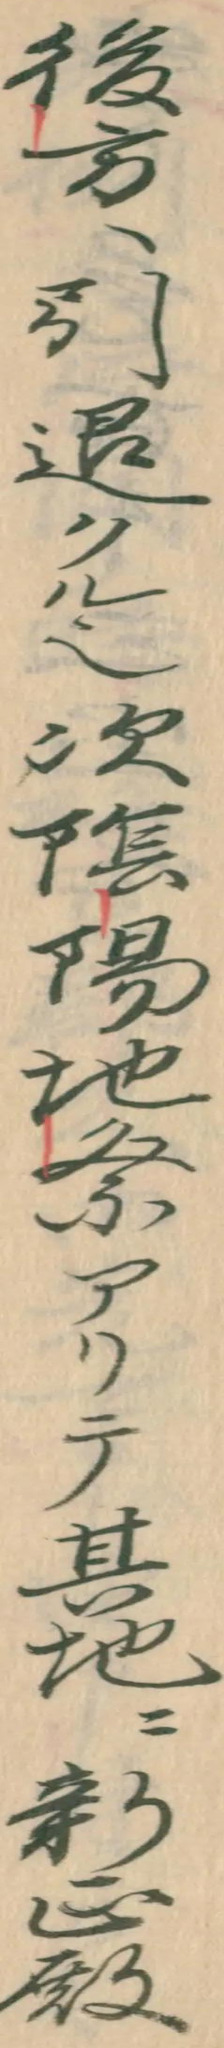後_方ヘ引退クル也次陰-陽地_祭アリテ其地ニ新正殿
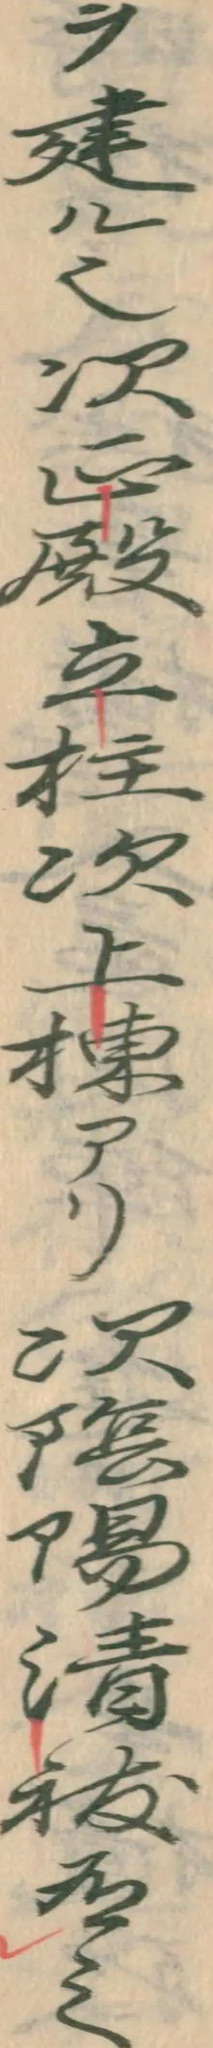ヲ建ル也次正-殿立-柱次上-棟アリ次陰陽清_祓有之
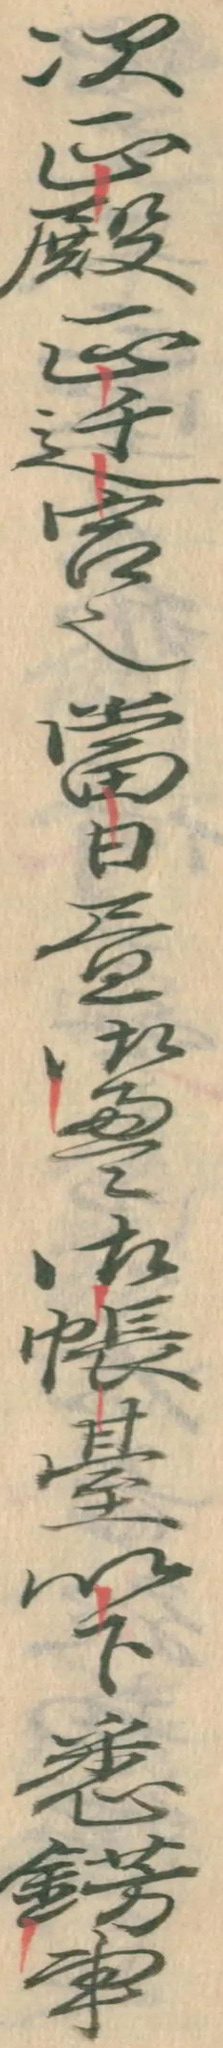次正-殿正-迁-宮也当-日昼御_畳御-帳-台以-下悉錺_事
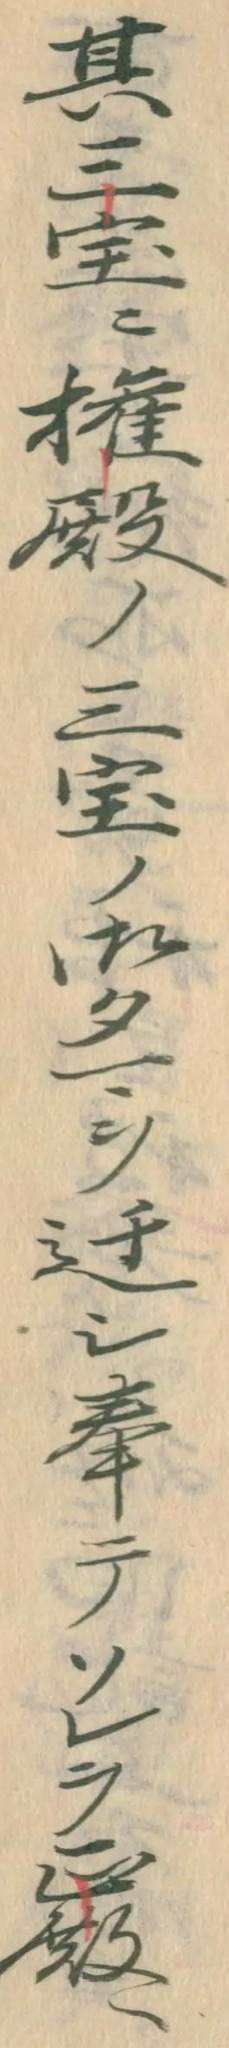其三-宝ニ権-殿ノ三宝ノ御タマヲ迁シ奉テソレヲ正-殿ヘ
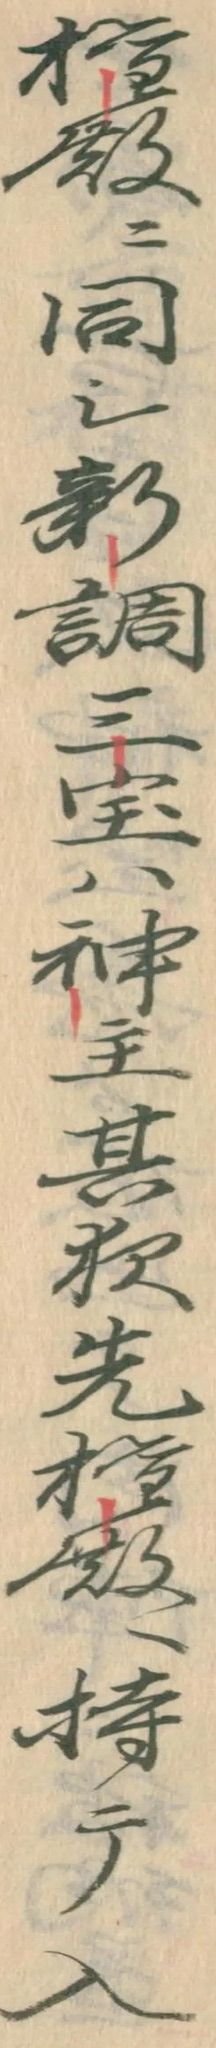権-殿ニ同シ新-調三-宝ハ神_主其夜先権-殿ヘ持テ入
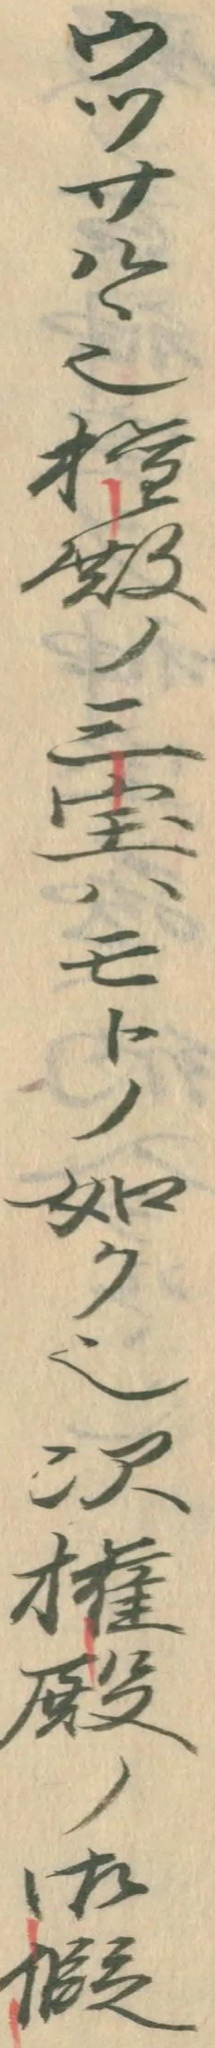ウツサルヽ也権-殿ノ三-宝ハモトノ如ク也次権-殿ノ御_仮_

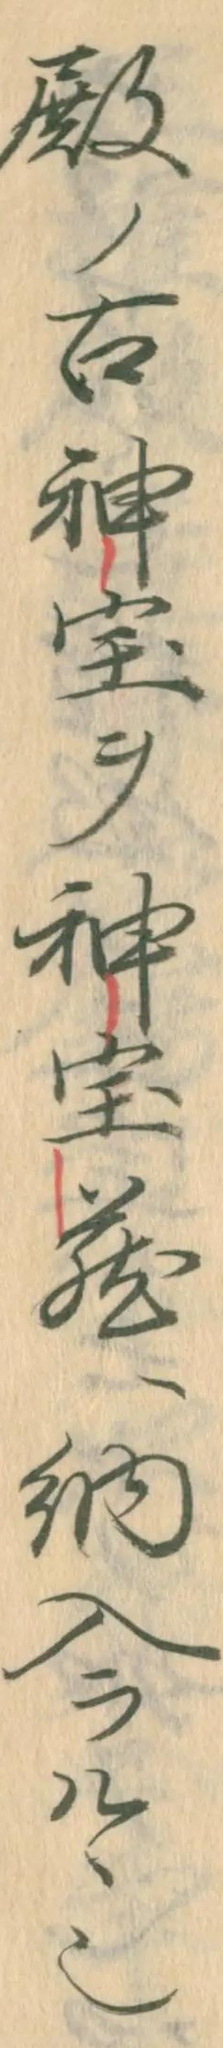殿ノ古神-宝ヲ神-宝_蔵ヘ納入ラルヽ也
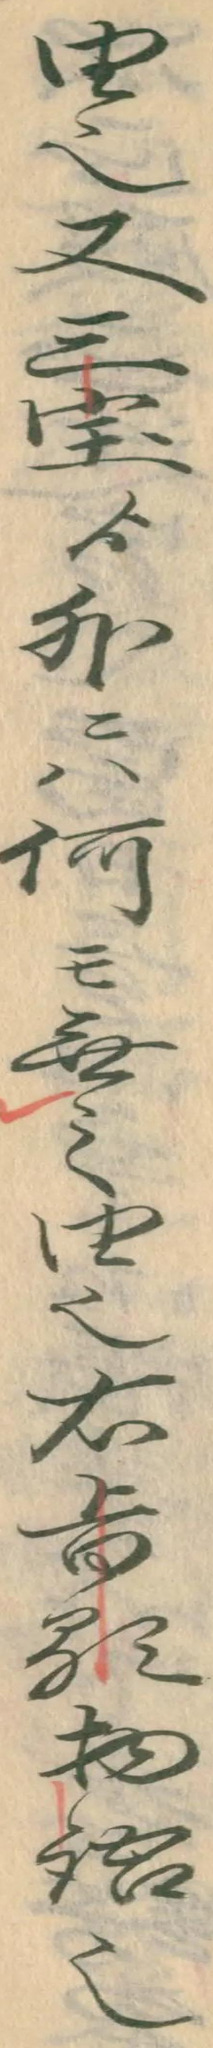由也又三-宝ゟ外ニハ何モ無之由也右旨顕物_語也
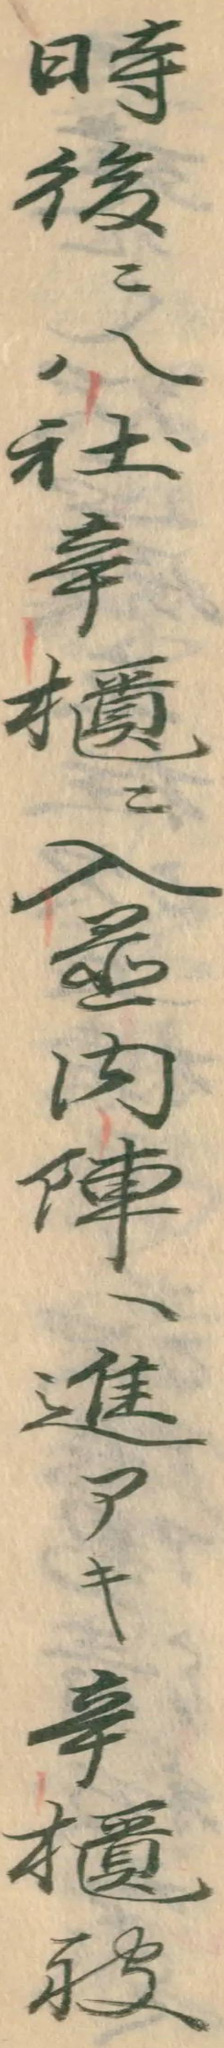時後ニ八-社辛_櫃ニ入_置-内陣ヘ進アキ辛_櫃被
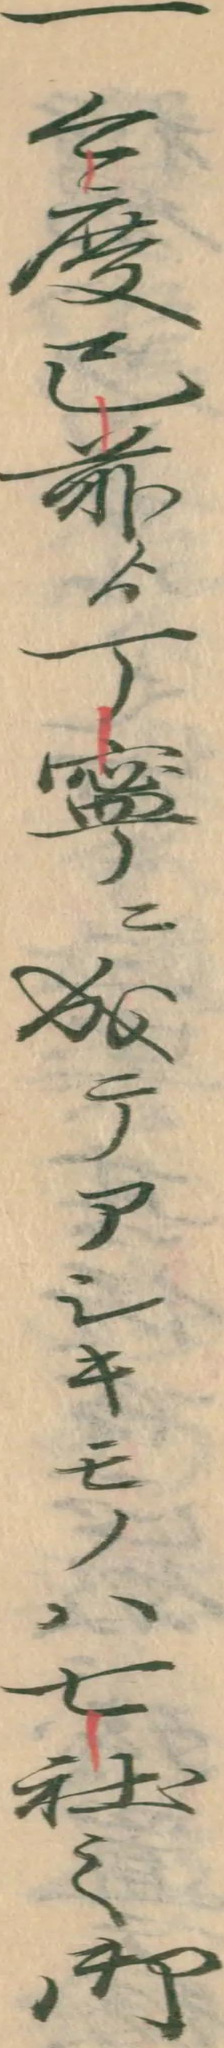一今度已-前ゟ丁-寧ニ成テアシキモノハ七-社之御
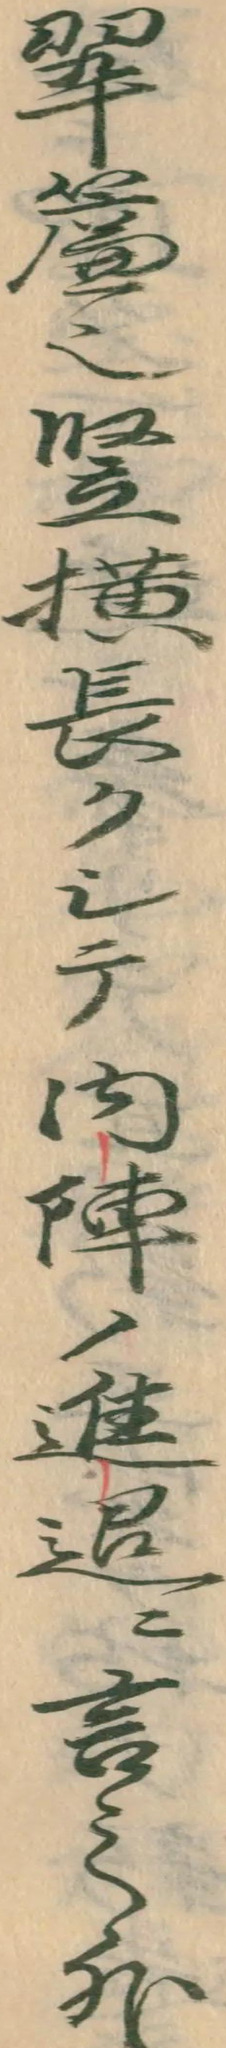翠簾也竪横長クシテ内-陣ノ進-退ニ言之外
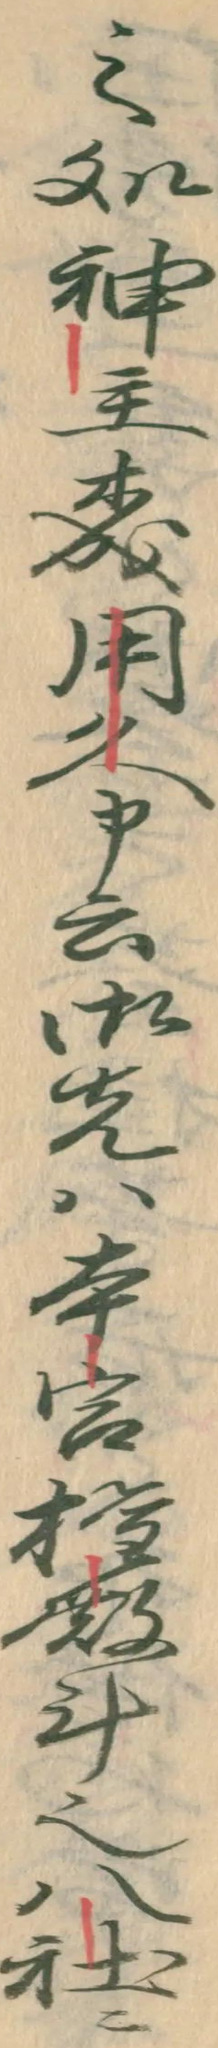之処神_主森用久申云御先ハ本-宮権-殿計也八-社ニ
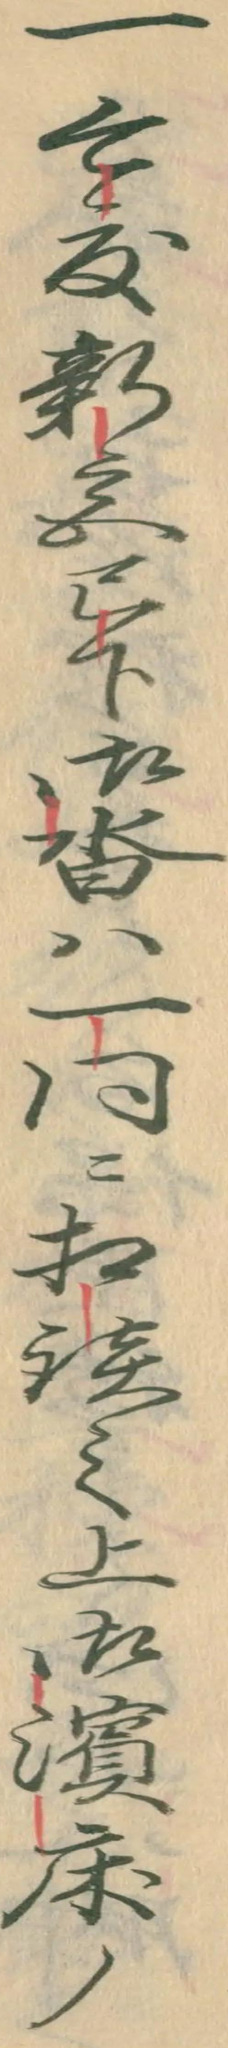一今-度新-宮已-下御_沓ハ一-同ニ相-談之上御_浜_床ノ
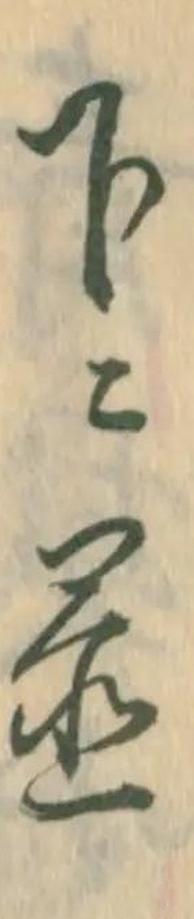下ニ置

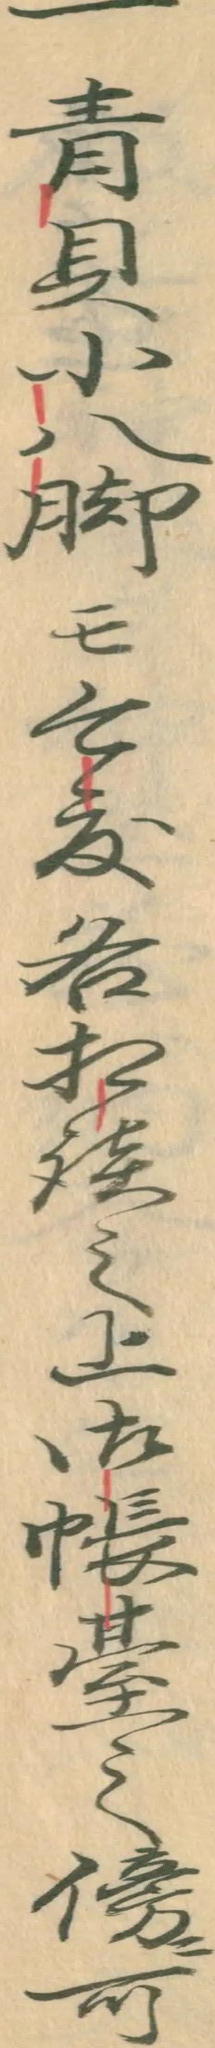一青_貝小_脚モ今-度各相-談之上御-帳-台之傍ニ可
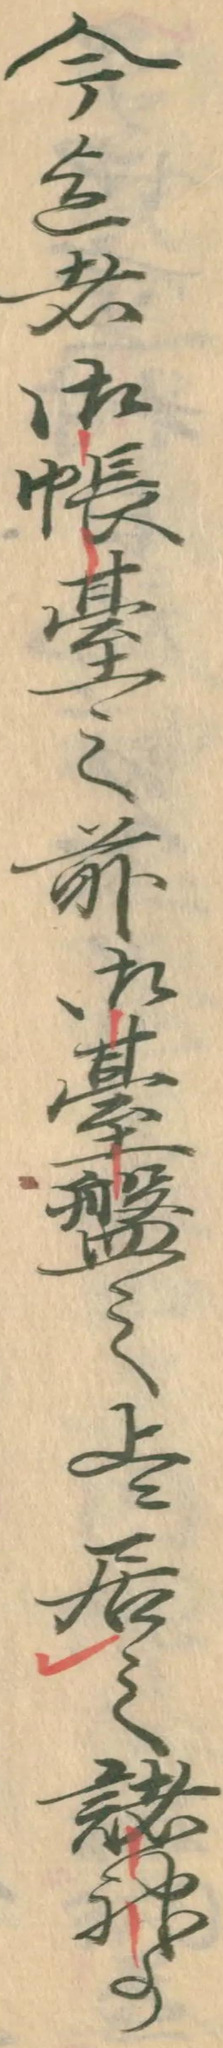今迄者御-帳-台之前御-台-盤之上ニ居之諸-神-事
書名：賀茂社記録. 第16冊
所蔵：国立国会図書館 National Diet Library, JAPAN
